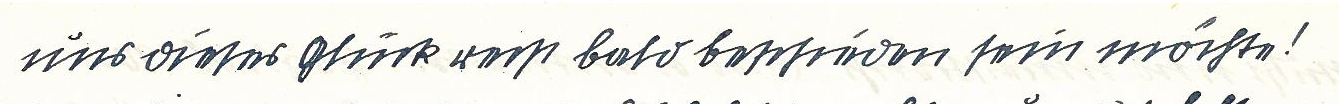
uns dieses Glück recht bald beschieden sein möchte!
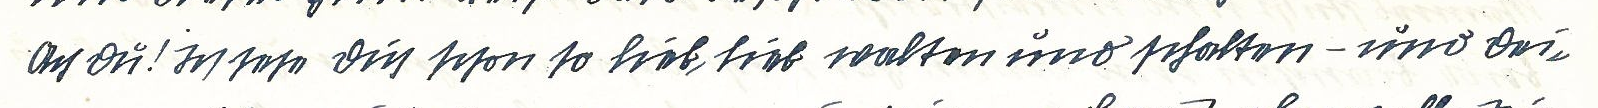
Ach Du! Ich sehe Dich schon so lieb, lieb walten und schalten – und Dei¬
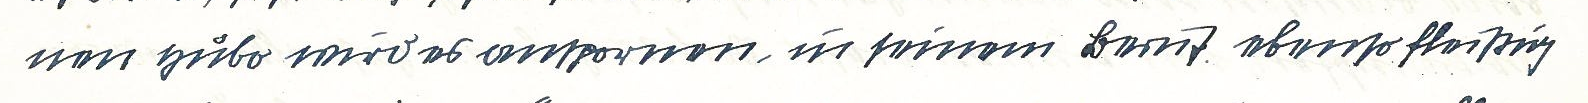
nen Hubo wird es anspornen, in seinem Beruf ebenso fleißig
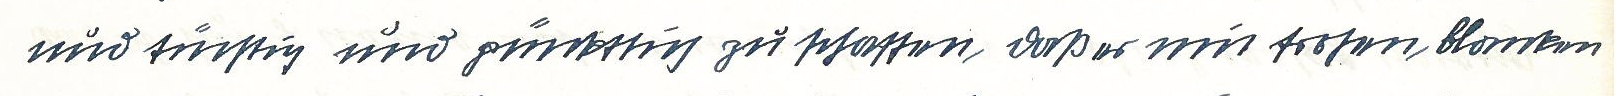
und tüchtig und glücklich zu schaffen, daß er mit frohen, blanken
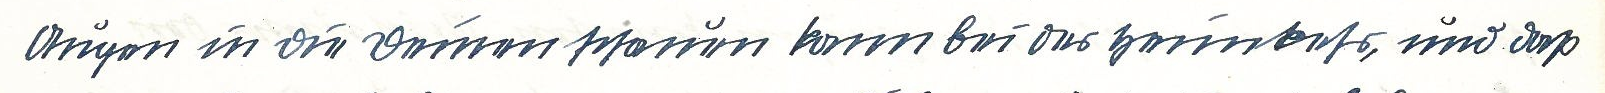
Augen in die Deinen schauen kann bei der Heimkehr, und daß
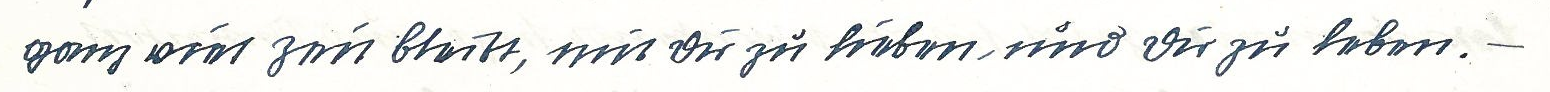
ganz viel Zeit bleibt, mit Dir zu lieben, und Dir zu leben. –
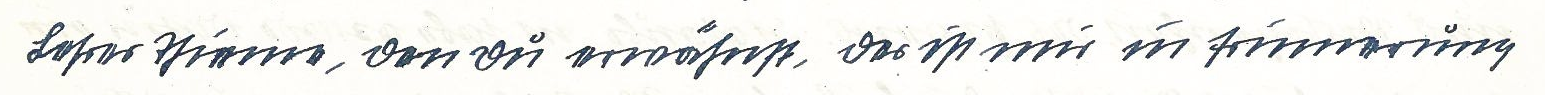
Lehrer Th., den Du erwähnst, der ist mir in Erinnerung
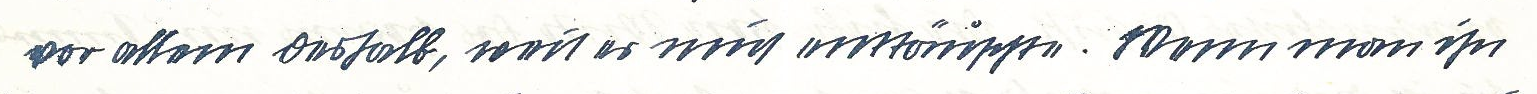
vor allem deshalb, weil er mich enttäuschte. Wenn man ihn
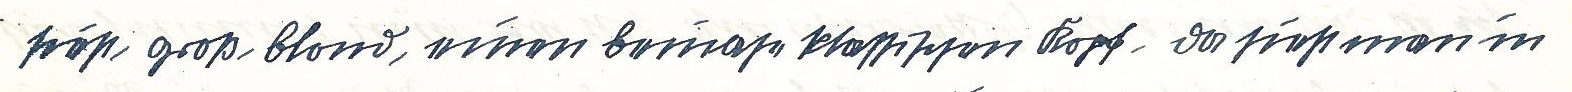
sieht, groß, blond, einen beinahe klassischen Kopf – da sieht man in
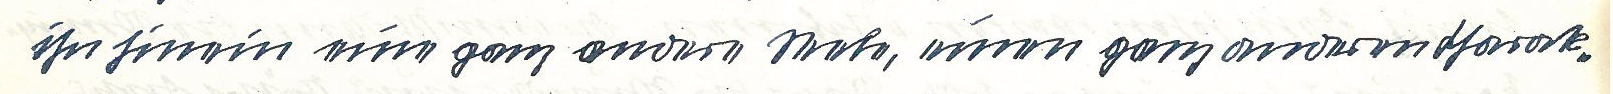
ihn hinein eine ganz andere Seele, einen ganz anderen Charak¬
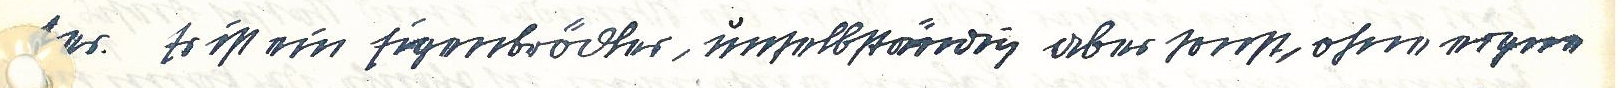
ter. Er ist ein Eigenbrödler, unselbständig aber sonst, ohne eigne
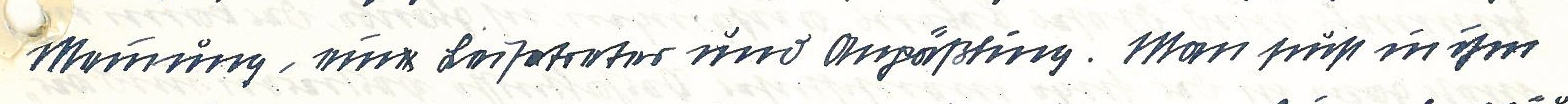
Meinung, ein Leisetreter und Anpäßling. Man sucht in ihm
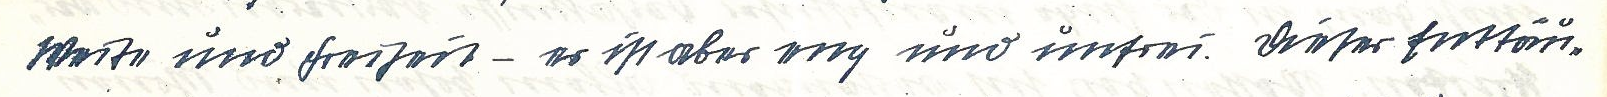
Weite und Freiheit – er ist aber eng und unfrei. Dieser Enttäu¬
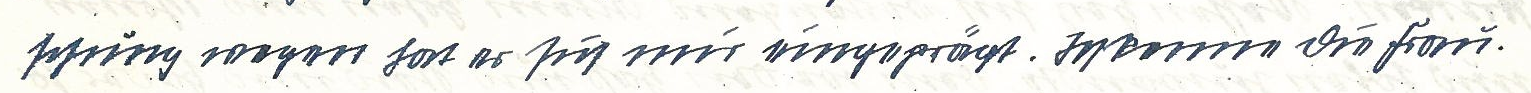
schung wegen hat er sich mir eingeprägt. Ich kenne die Frau.
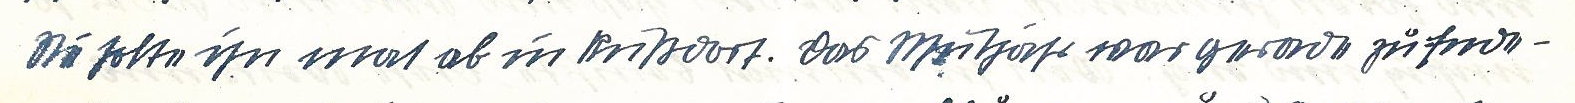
Sie holte ihn mal ab in R. Das Schuljahr war gerade zu Ende –
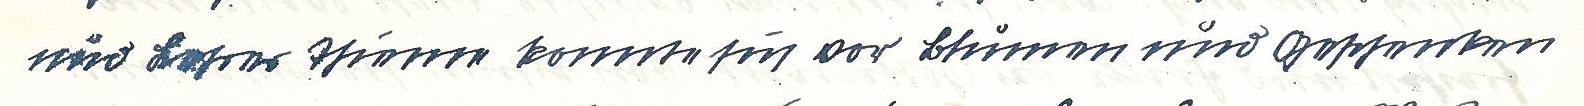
und Lehrer Th. konnte sich vor Blumen und Geschenken
